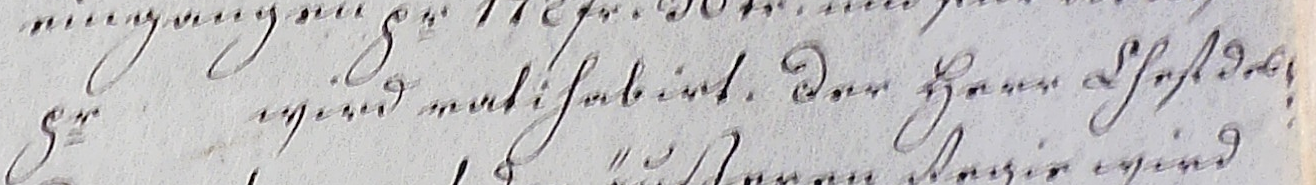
pr͇ wird ratihabirt. Der Herr Chef des
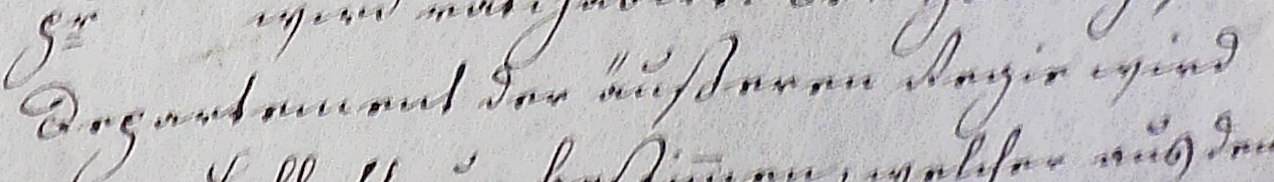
Departement der äußeren Regie wird
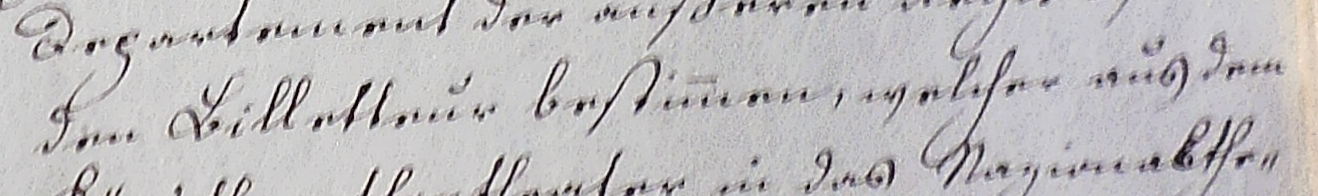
den Billetteur bestim̅en, welcher aus dem
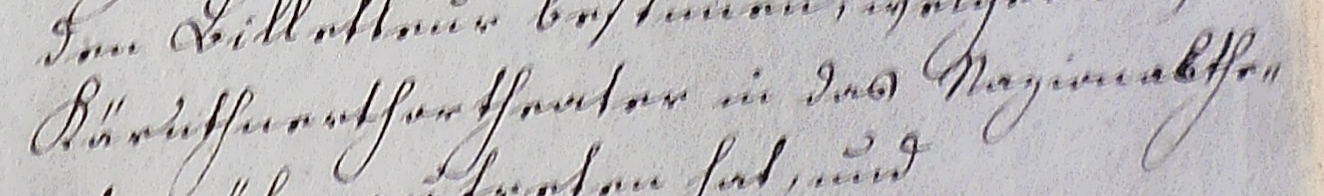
Kärnthnerthortheater in das Nazionalthe¬
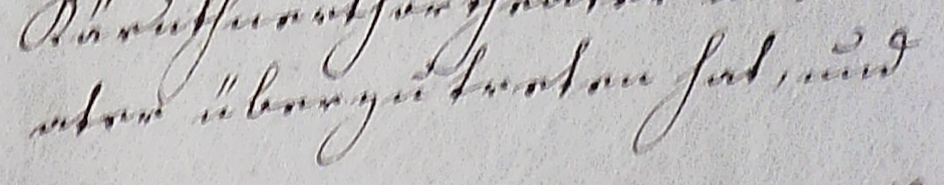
ater überzutreten hat, und
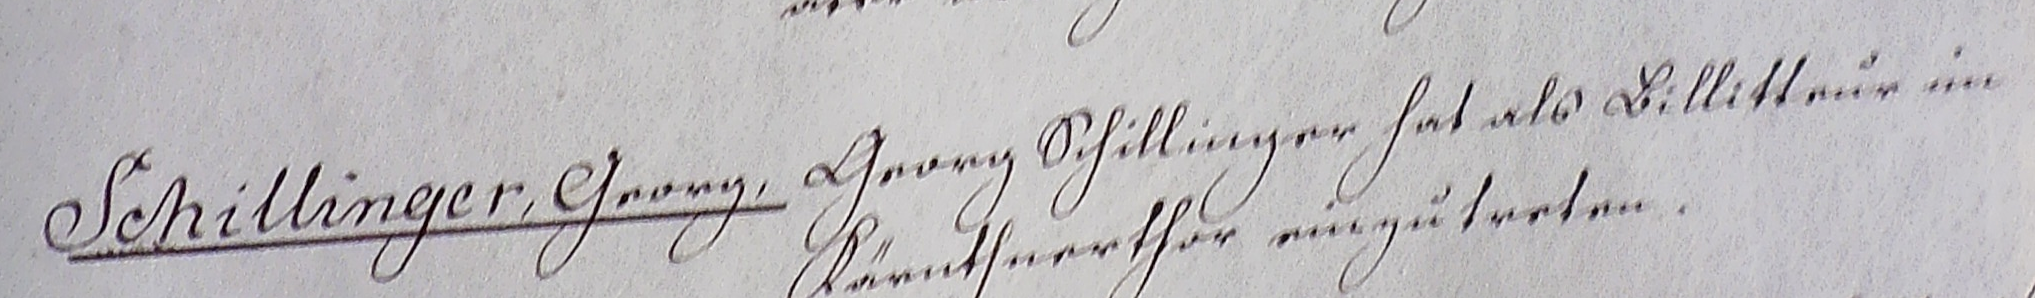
Schillinger, Georg. Georg Schillinger hat als Billitteur im
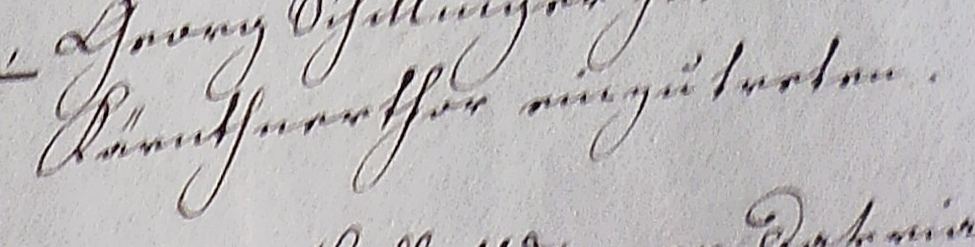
Kärnthnerthor einzutreten.
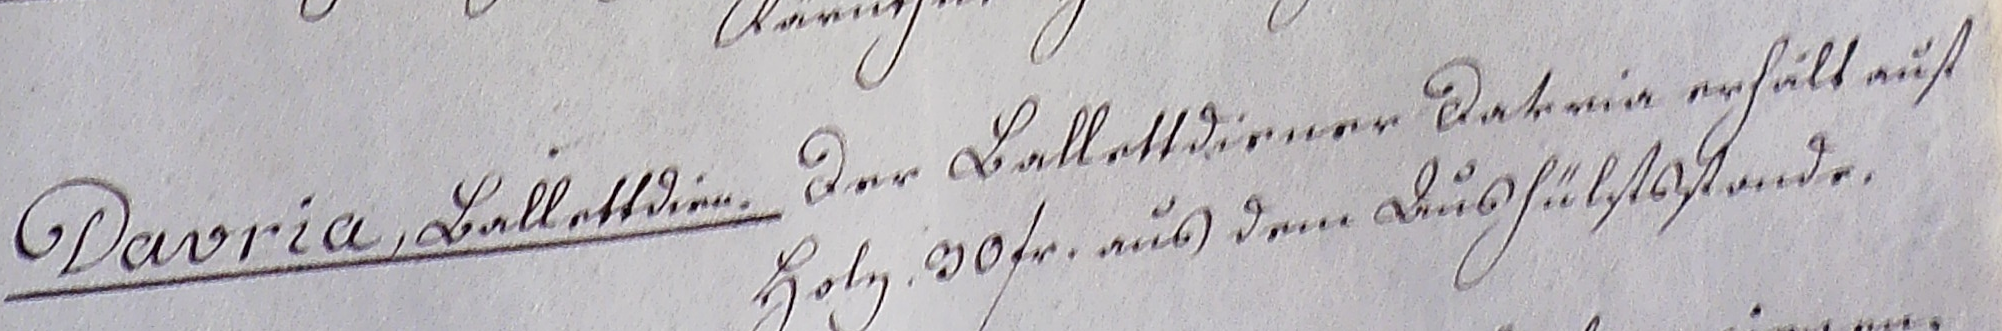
Davria, Ballettdien. Der Balletdiener Davria erhält auf
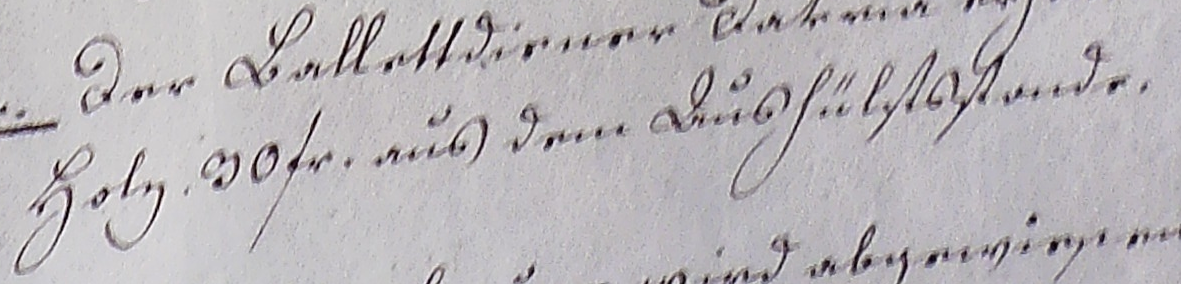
Holz 30fr. aus dem Aushülfsfonde.
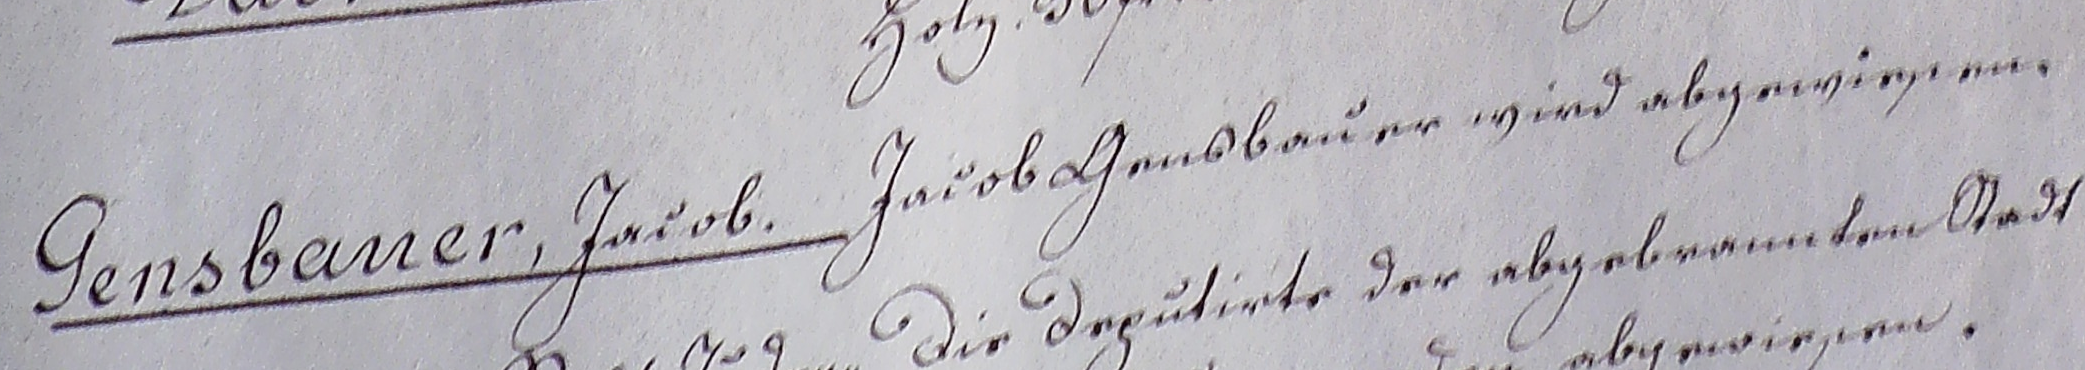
Gensbauer, Jacob. Jacob Gensbauer wird abgewiesen.
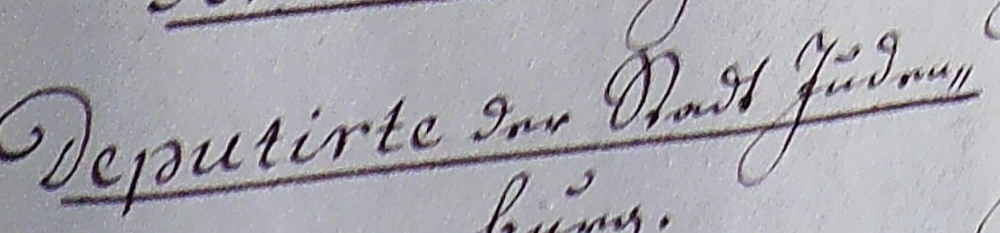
Deputirte der Stadt Juden¬
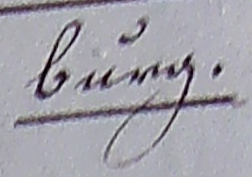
burg.
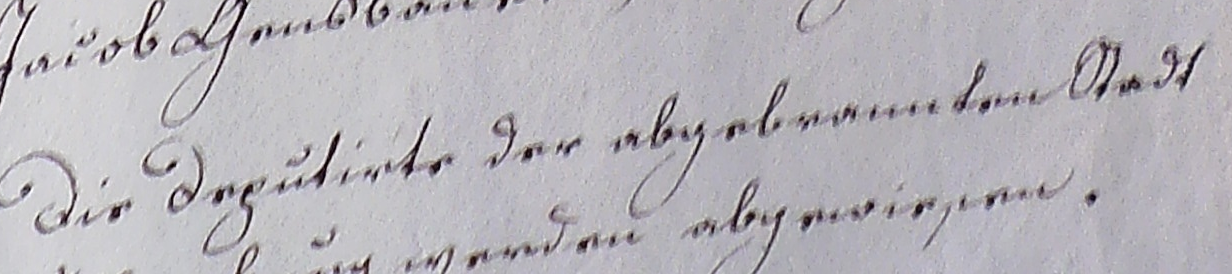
Die Deputirte der abgebrannten Stadt
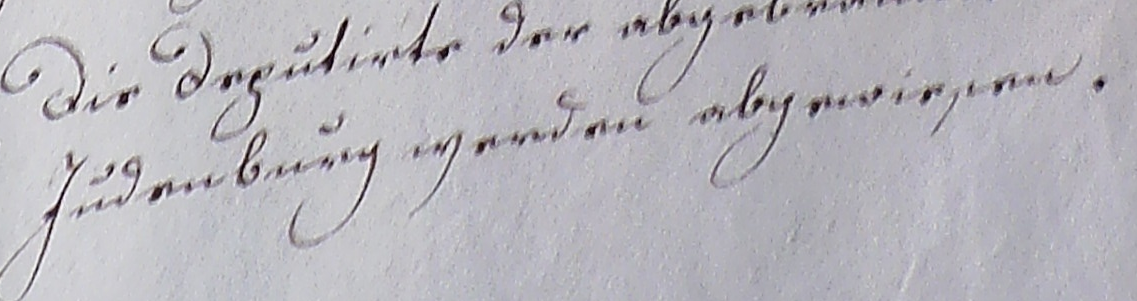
Judenburg werden abgewiesen.
